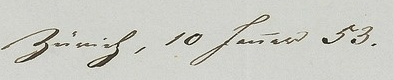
Zürich, 10 Jenner 53.
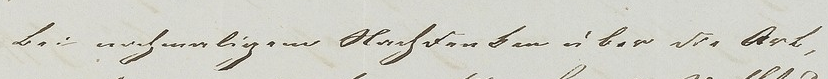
Bei nochmaligem Nachdenken über die Art,
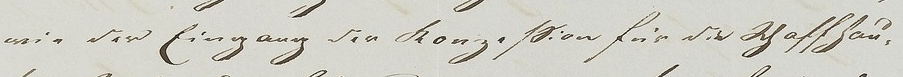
wie der Eingang der Konzession für die Schaffhau-
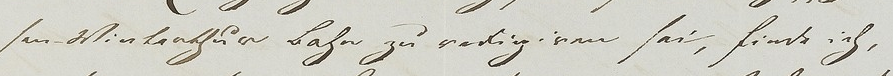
sen–Winterthur Bahn zu redigiren sei, finde ich,
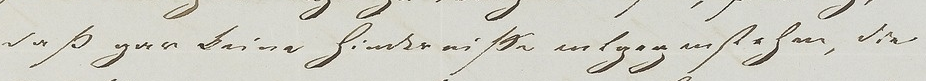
daß gar keine Hindernisse entgegenstehen, die
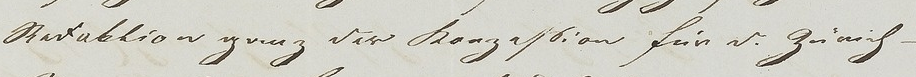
Redaktion ganz der Konzession für d. Zürich–
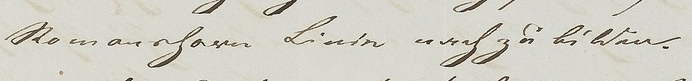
Romanshorn Linie nachzubilden.
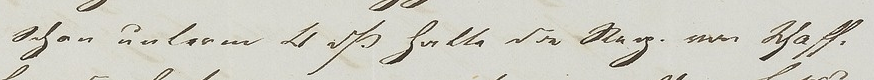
Schon unterm 4 dss hatte die Reg. von Schaff-
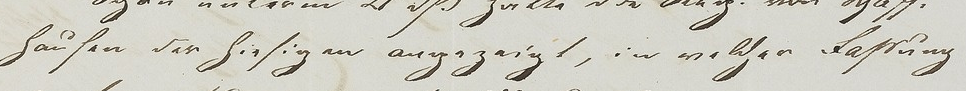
hausen der hiesigen angezeigt, in welcher Fassung
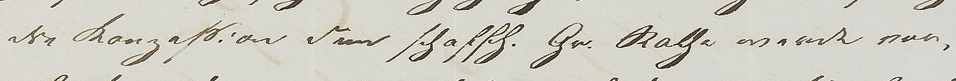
die Konzession dem schaffh. Gr. Rathe werde vor-
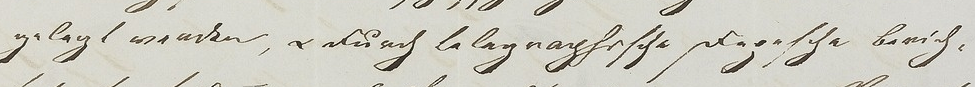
gelegt werden, & durch telegraphische Depesche berich-
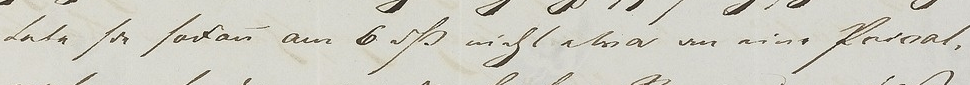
tete sie sodann am 6 dss nicht etwa an eine Privat-
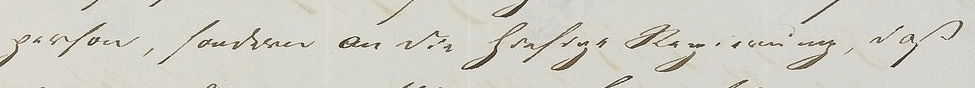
person, sondern an die hiesige Regierung, daß
